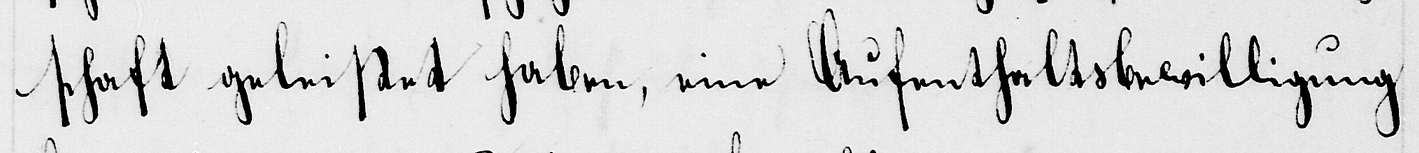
schaft geleistet haben, eine Aufenthaltsbewilligung
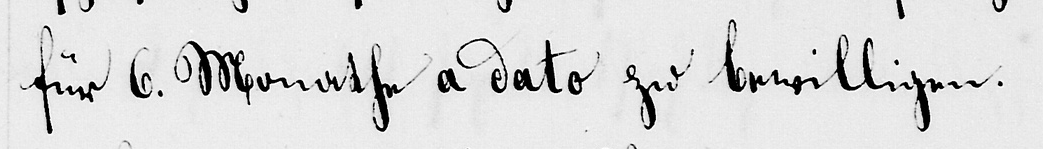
für 6. Monathe a dato zu bewilligen.
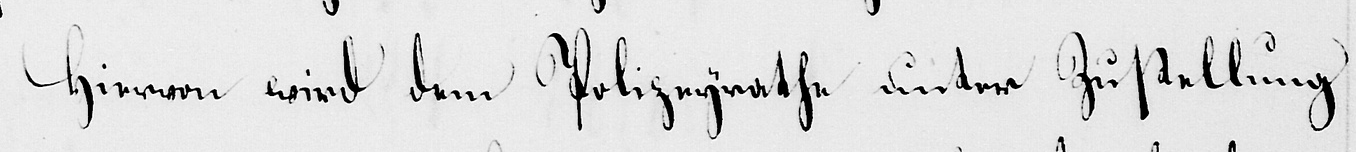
Hiervon wird dem Polizeyrathe unter Zustellung
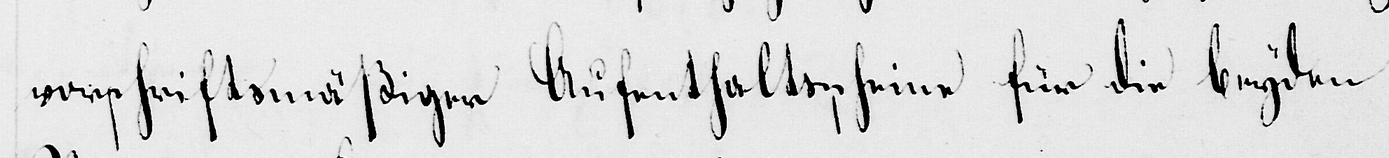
vorschriftsmäßiger Aufenthaltsscheine für die beyden
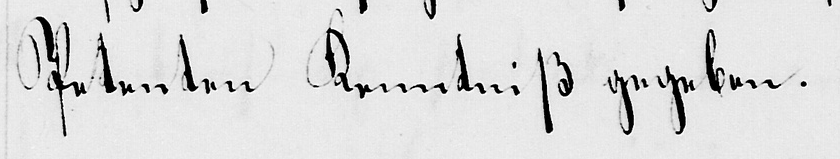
Petenten Kenntniß gegeben.
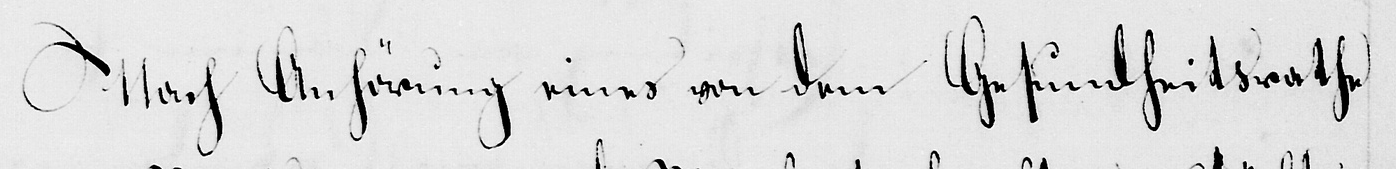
Nach Anhörung eines von dem Gesundheitsrathe
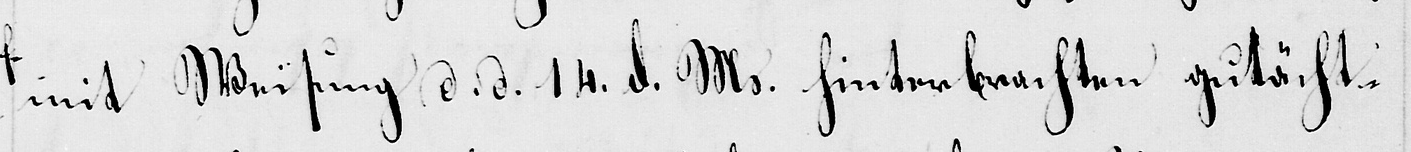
mit Weisung d. d. 14. d. Ms. hinterbrachten gutächt¬
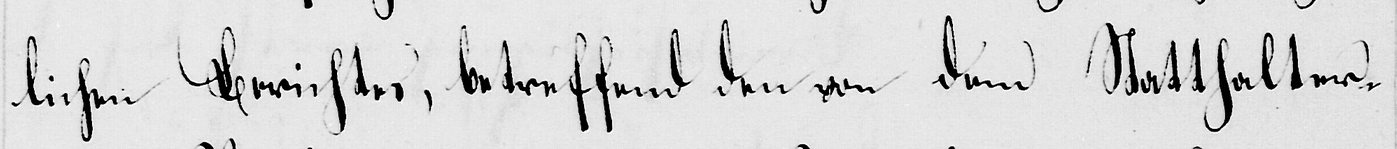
lichen Berichtes, betreffend den von dem Statthalter¬
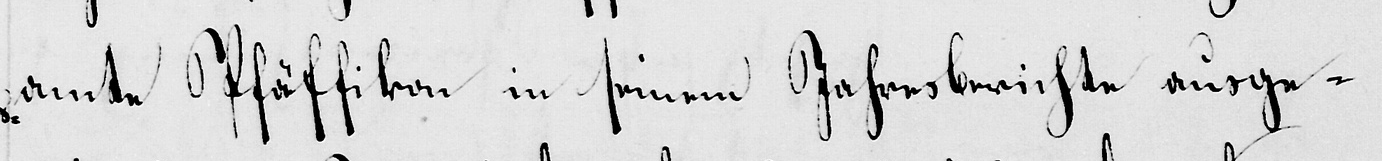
amte Pfäffikon in seinem Jahresberichte ausge¬
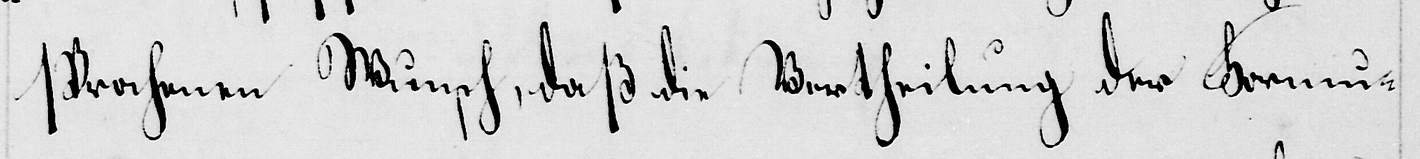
sprochenen Wunsch, daß die Vertheilung der Formu-
